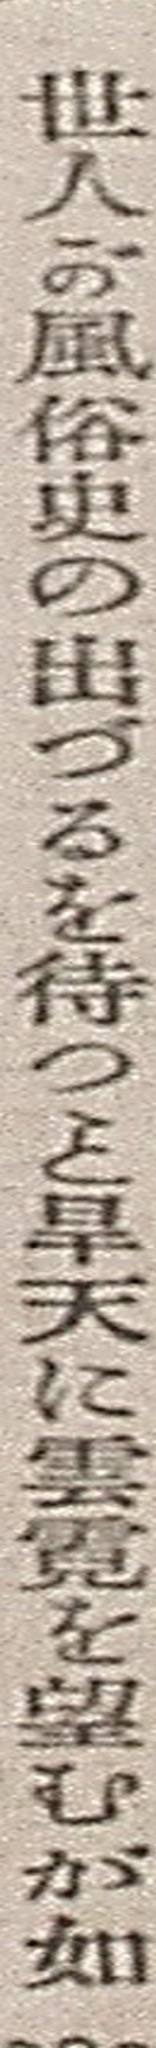世人が風俗史の出づるを待つこと旱天に雲霓を望むが如
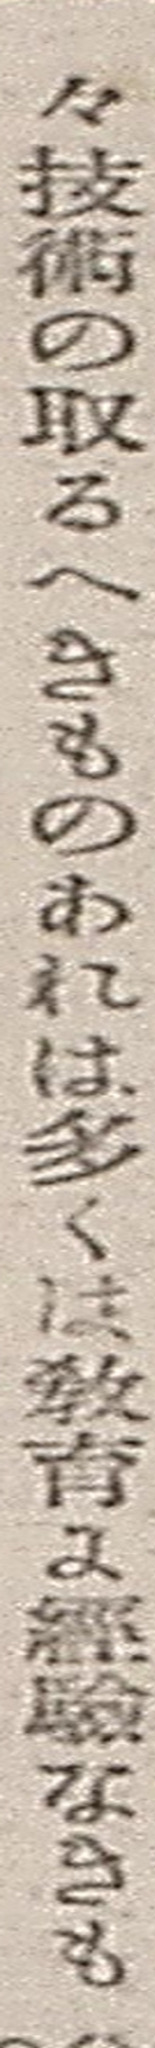々技術の取るへきものあれは多くは教育に経験なきも
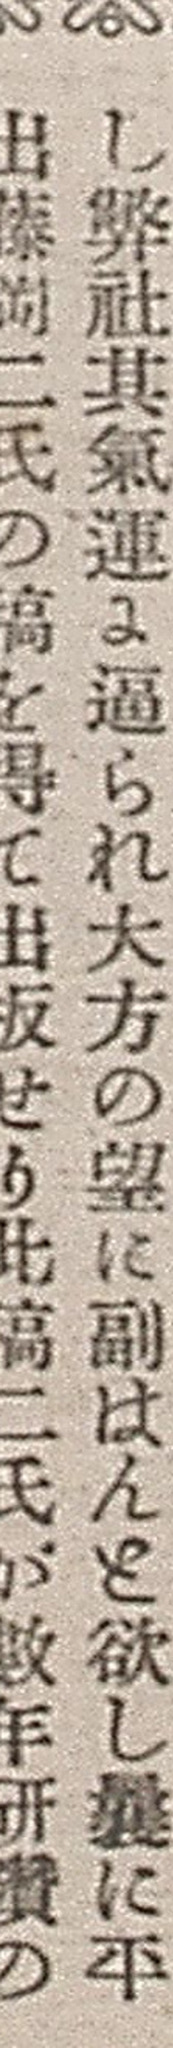し弊社其気運に逼られ大方の望に副はんと欲し曩に平
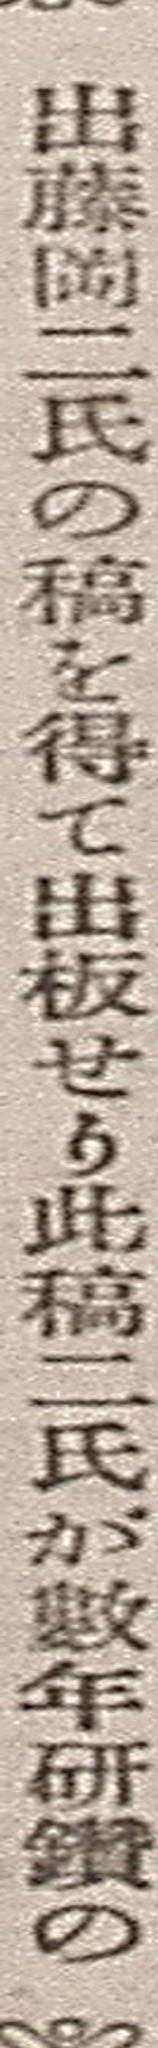出藤岡二氏の稿を得て出版せり此稿二氏が数年研鑽の
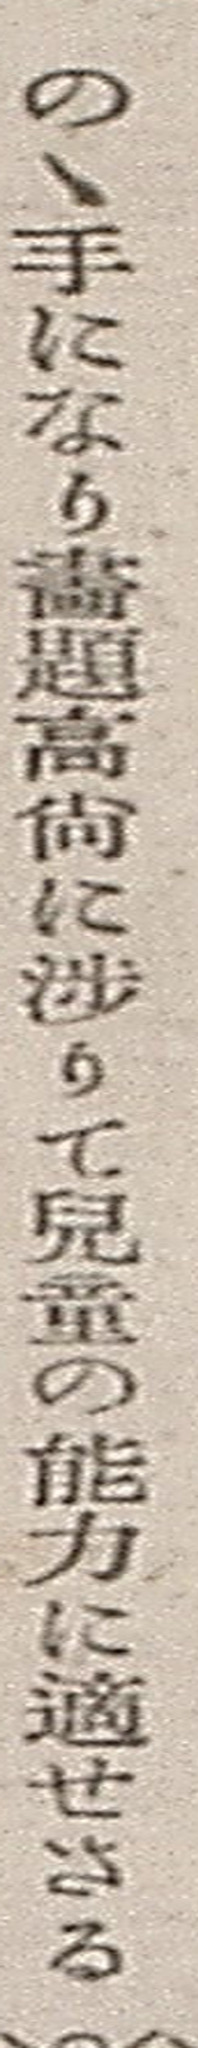のゝ手になり畫題高尚に渉りて兒童の能力に適せさる
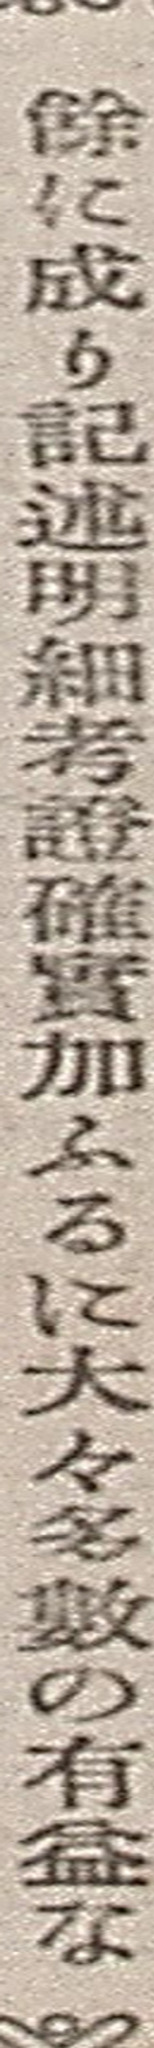餘に成り記述明細考證確実加ふるに大々多数の有益な
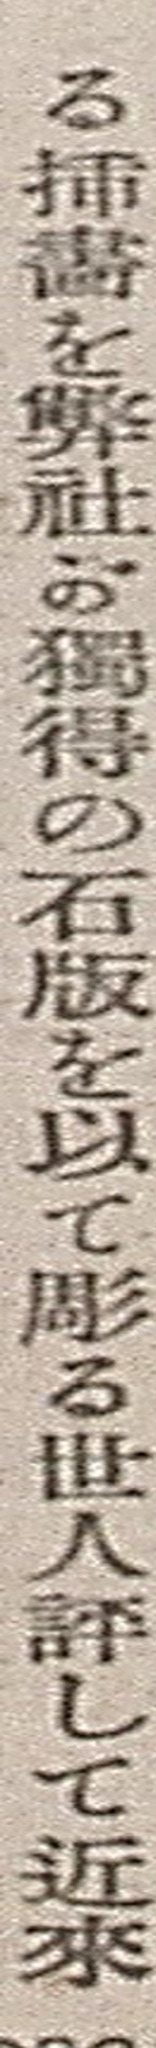る挿畫を弊社が独特の石版を以て彫る世人評して近来
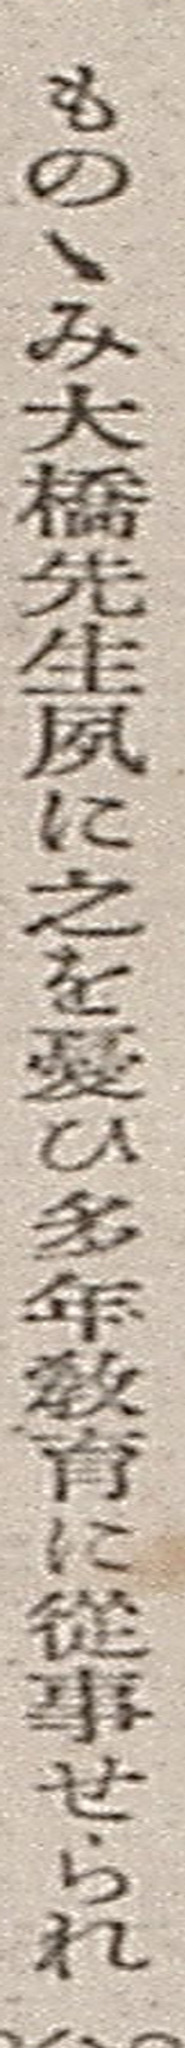ものゝみ大橋先生夙に之を憂ひ多年教育に従事せられ
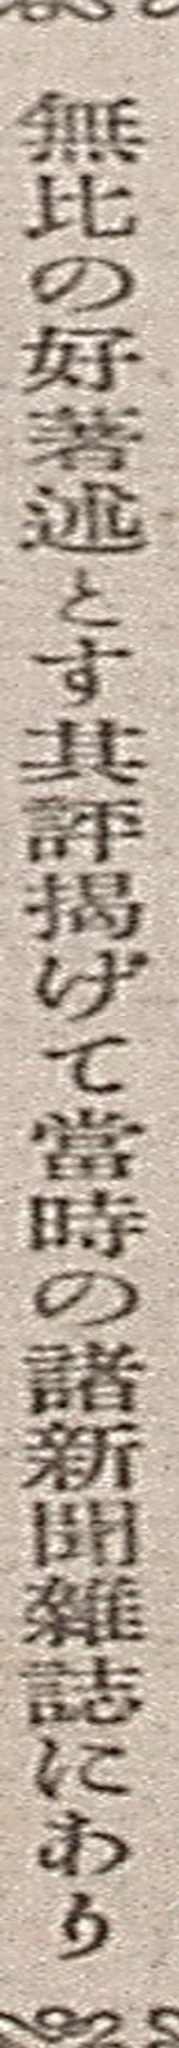無比の好著述とす其評揚げて当時の諸新聞雑誌にあり
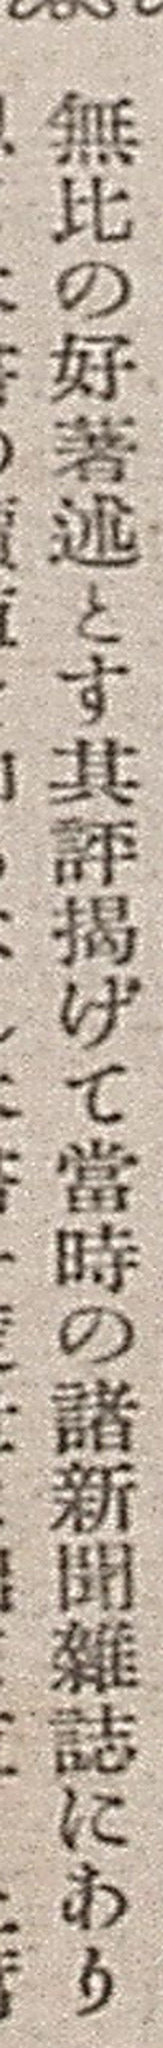無比の好著述とす其評揚げて当時の諸新聞雑誌にあり
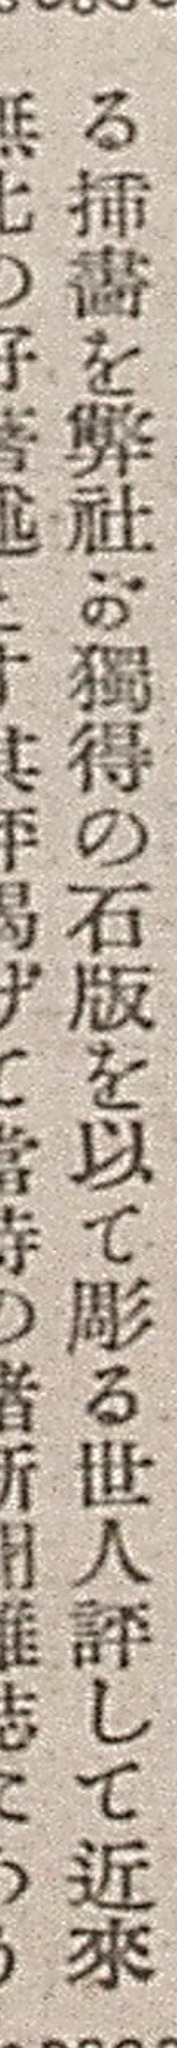る挿畫を弊社が独特の石版を以て彫る世人評して近来
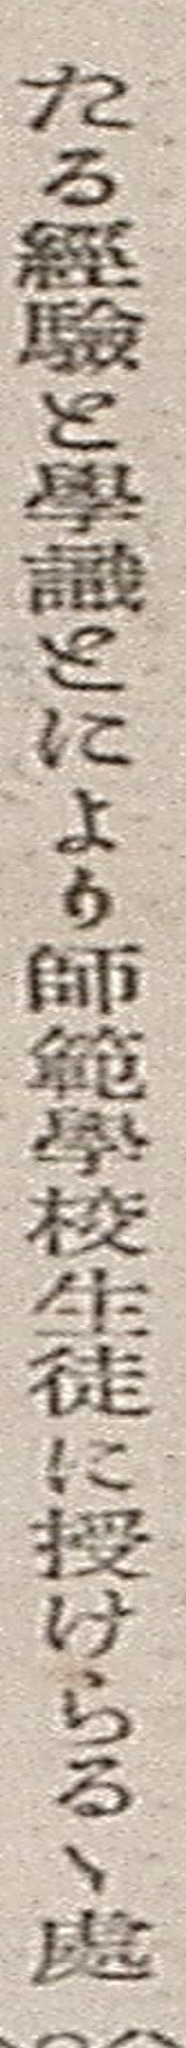たる経験と学識とにより師範学校生徒に授けらるゝ処
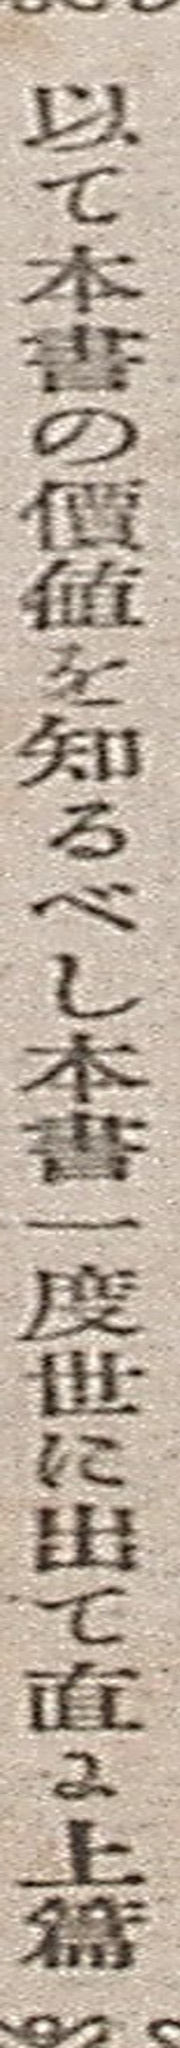以て本書の価値を知るべし本書一度世に出て直に上編
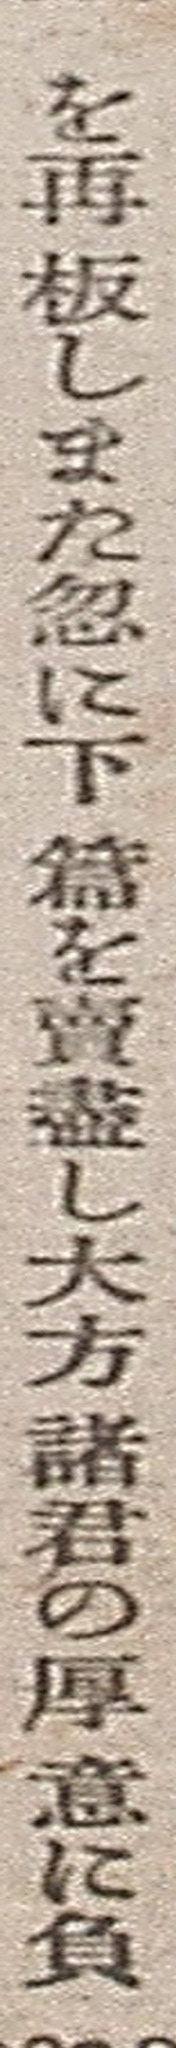を再版しまた忽に下編を売盡し大方諸君の厚意に負
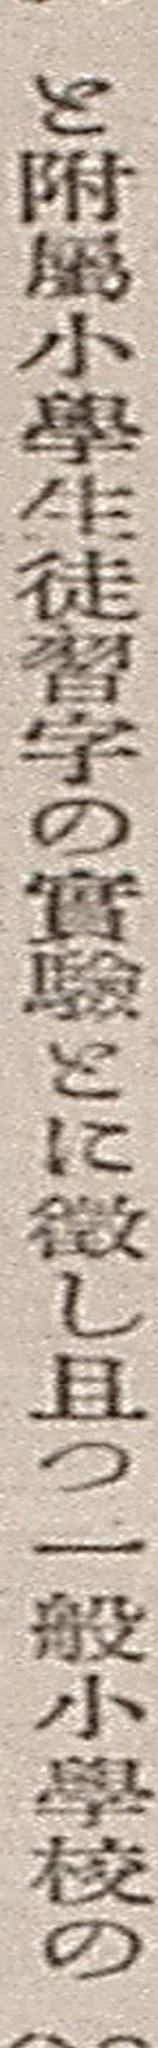と附属小学校生徒習字の実験とに徴し且つ一般小学校の
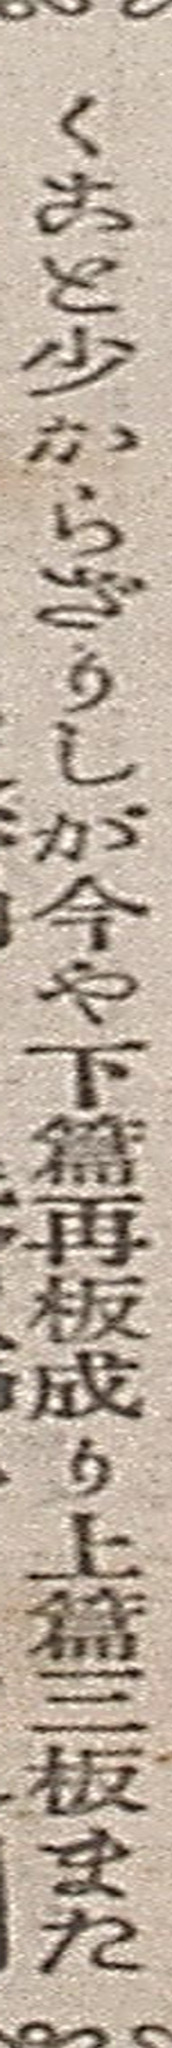くこと少からざりしが今や下編再版成り上編三板又
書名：風俗畫報臨時増刊第百二十六號　洪水被害録（中）
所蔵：東京大学地震研究所図書室 Earthquake Research Institute Library, The University of Tokyo, JAPAN
